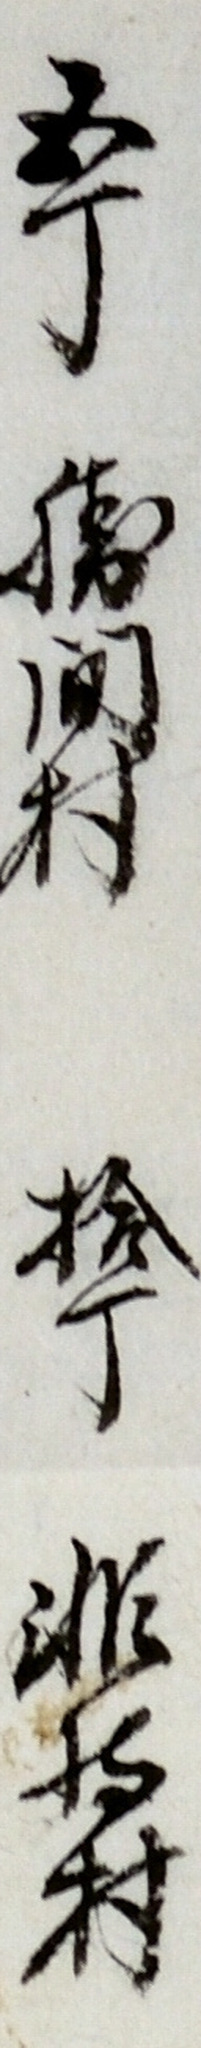五丁勝間村拾丁非持村
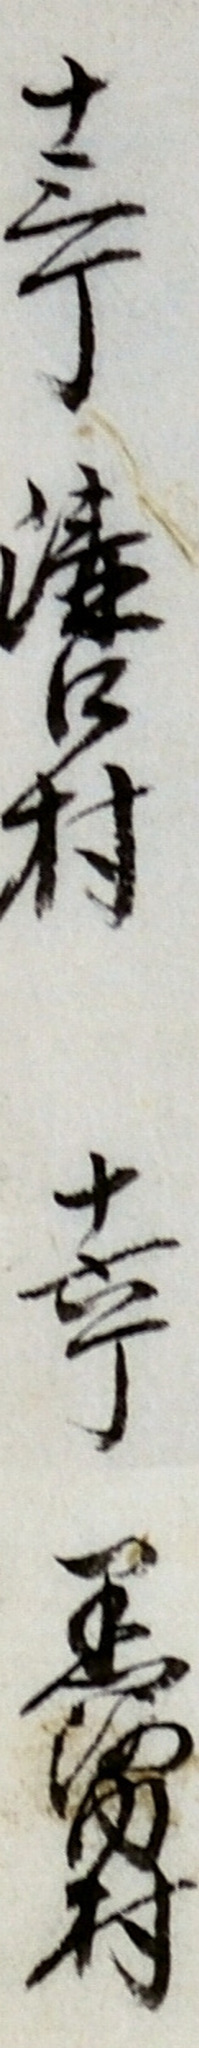十三丁溝口村十六丁黒河内村
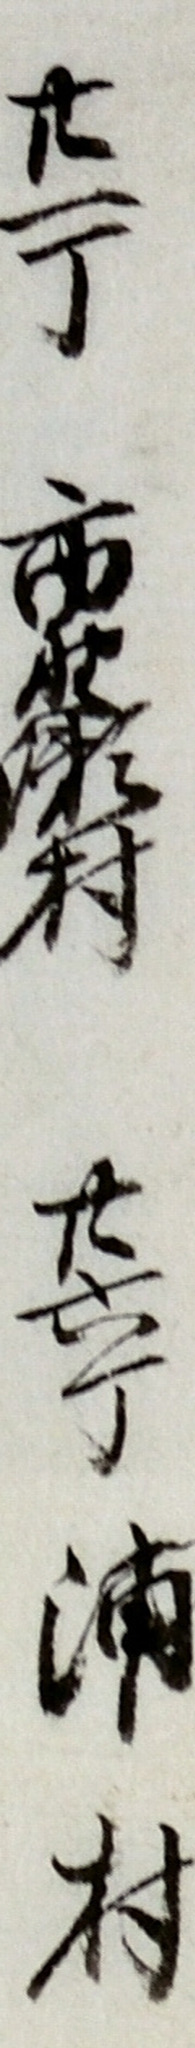廿一丁市野瀬村廿六丁浦村
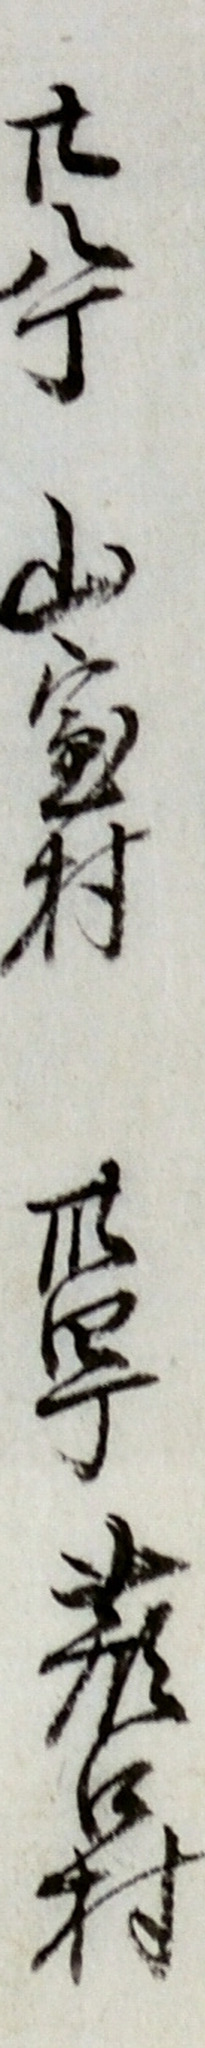廿八丁山室村卅四丁荊口村
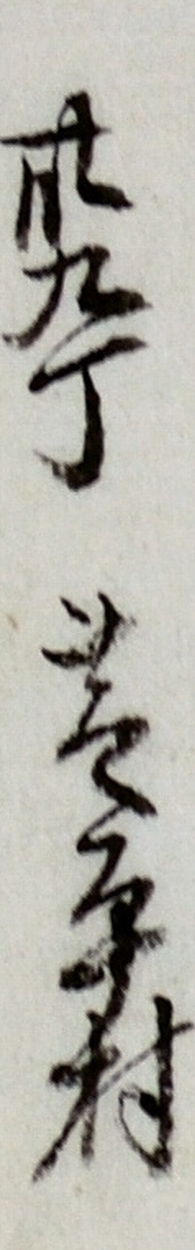卅九丁芝平村

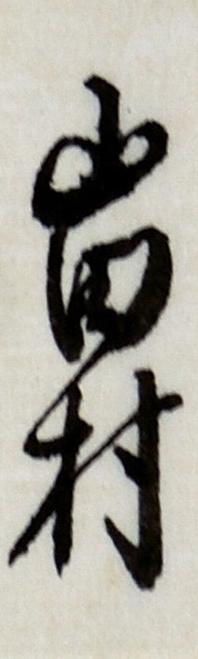山田村
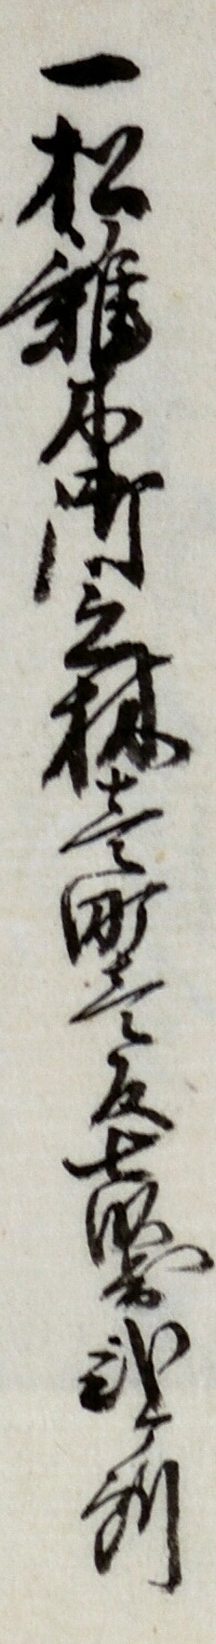一松雑木御立林壱町壱反七畝歩弐ヶ所
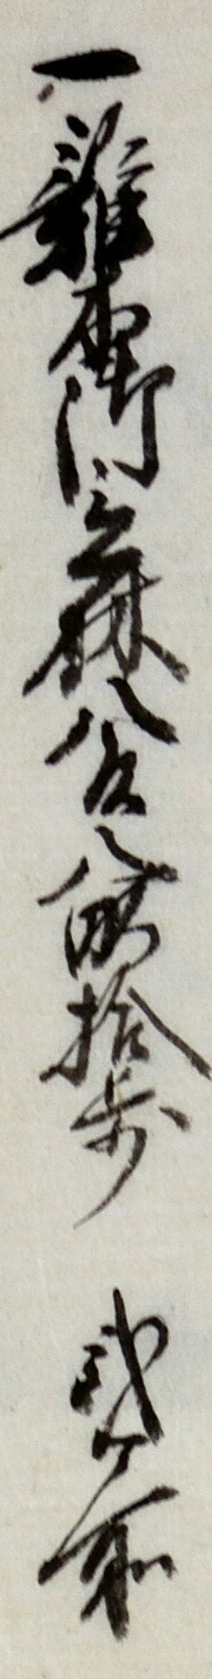一雑木御立林八反八畝拾歩弐ヶ所
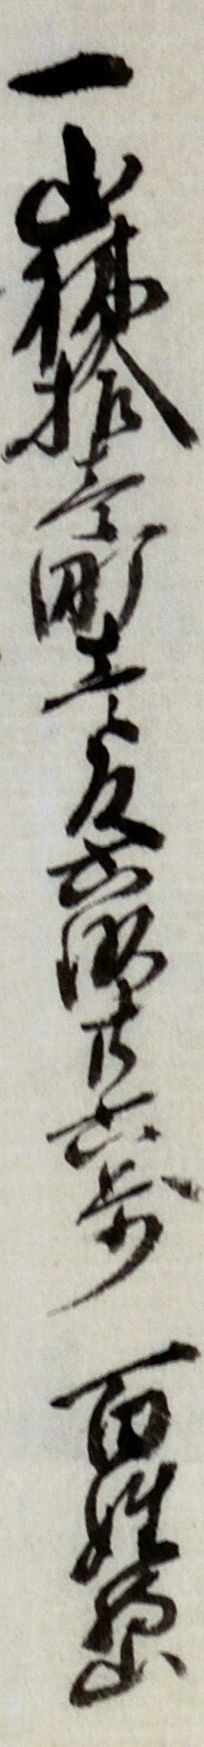一山林拾壱町壱反六畝廿六歩百姓持山
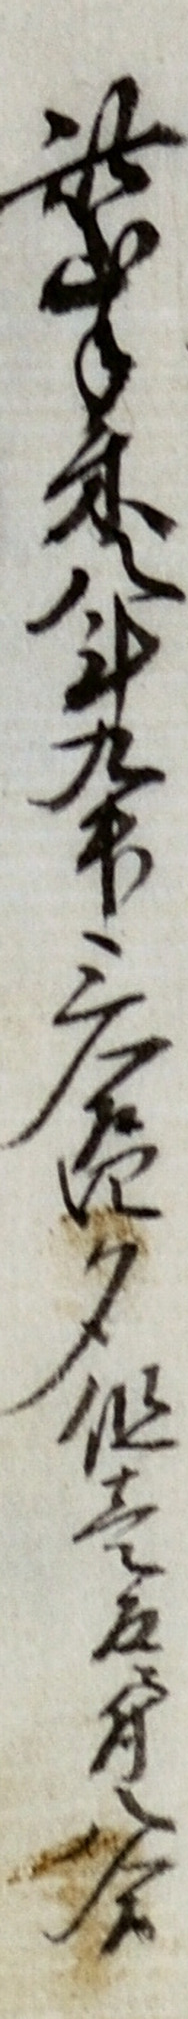此山手米八斗九升三合四夕但壱反ニ付八合
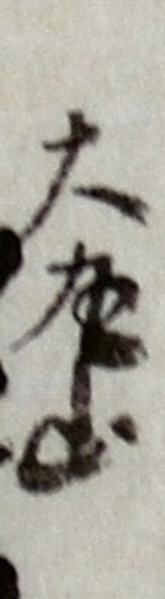大丸山
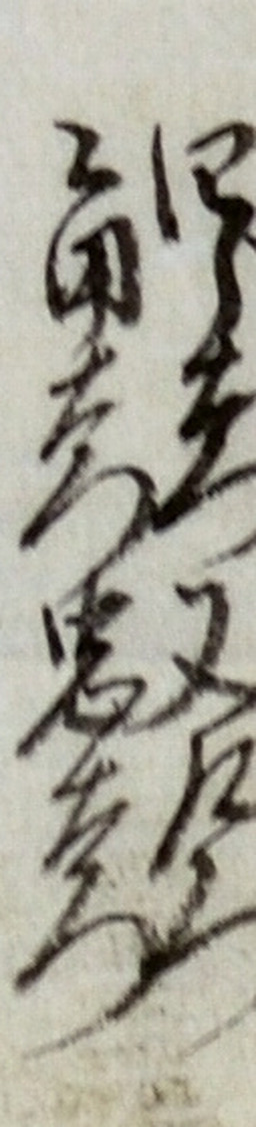角右衛門忠右衛門
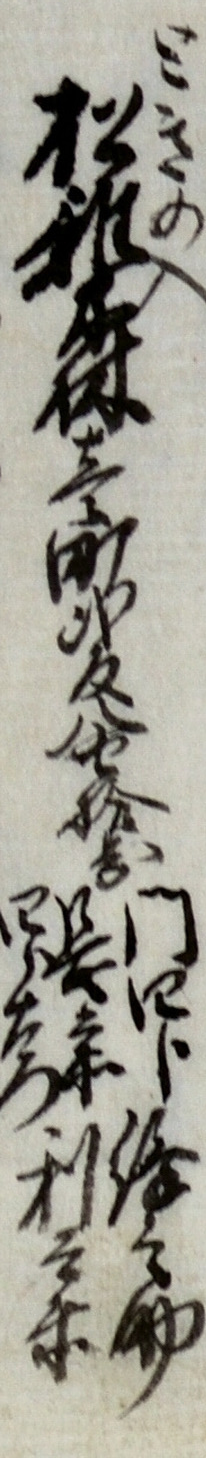松雑木林壱町弐反八セ拾歩門四郎縫之助
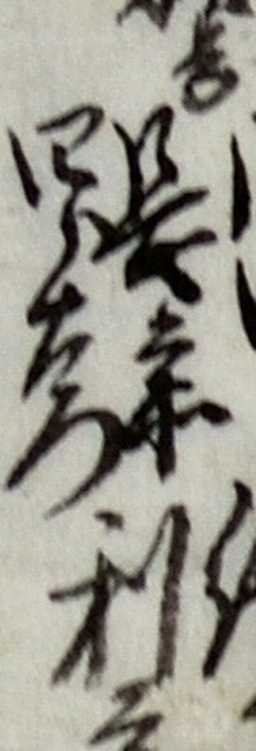四郎右衛門

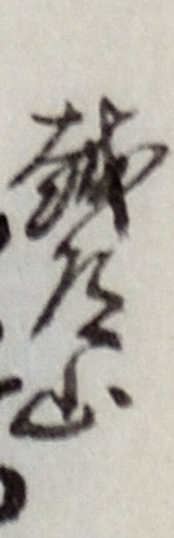越道山
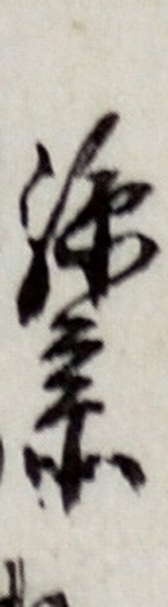又兵衛
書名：御領分中山林社地手控
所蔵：伊那市立高遠町図書館・合同会社AMANE
